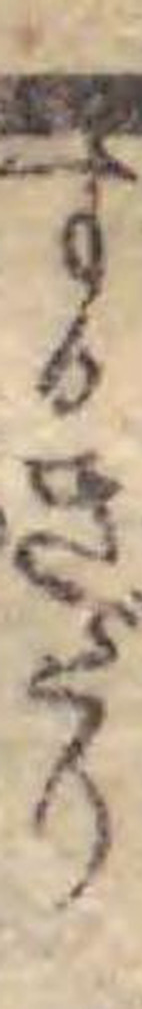するきどり
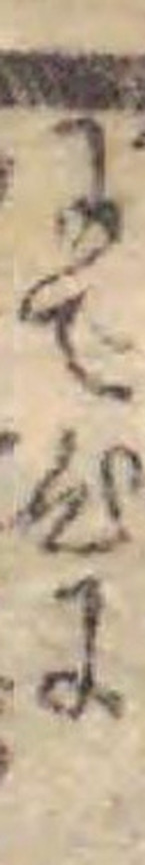にて心に
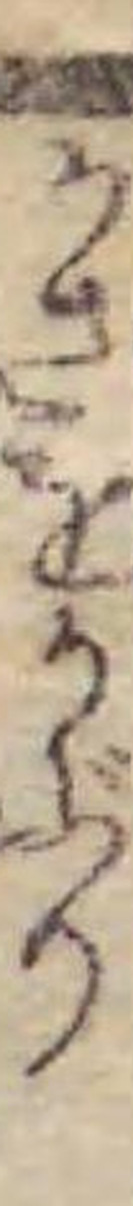かさをかぶり
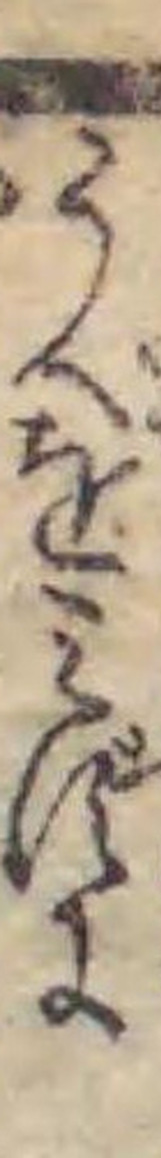うへをみずに
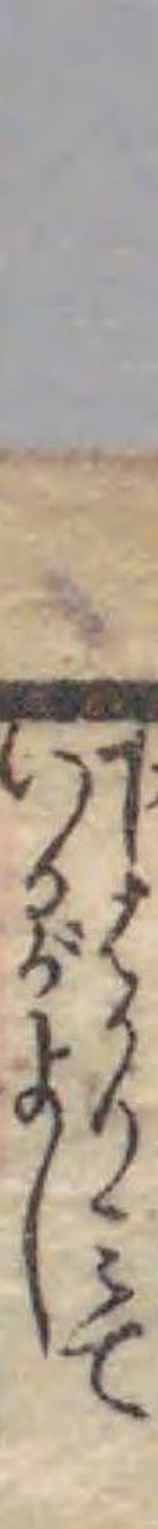いるがよし
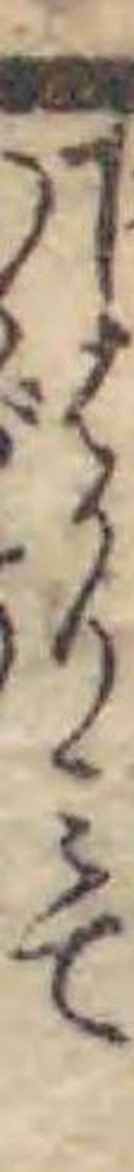下はかりみて
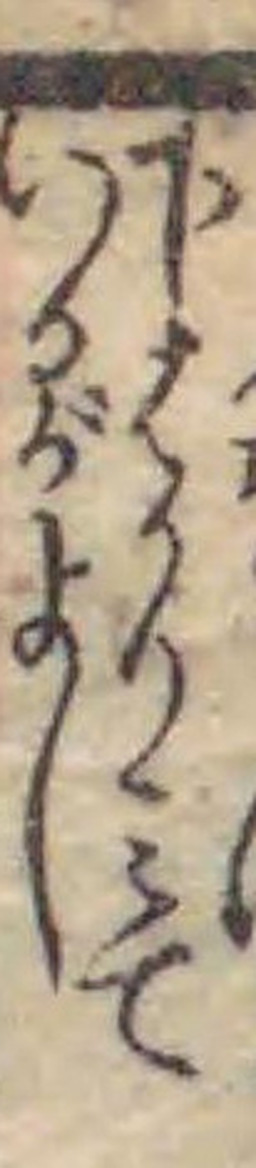いるがよし
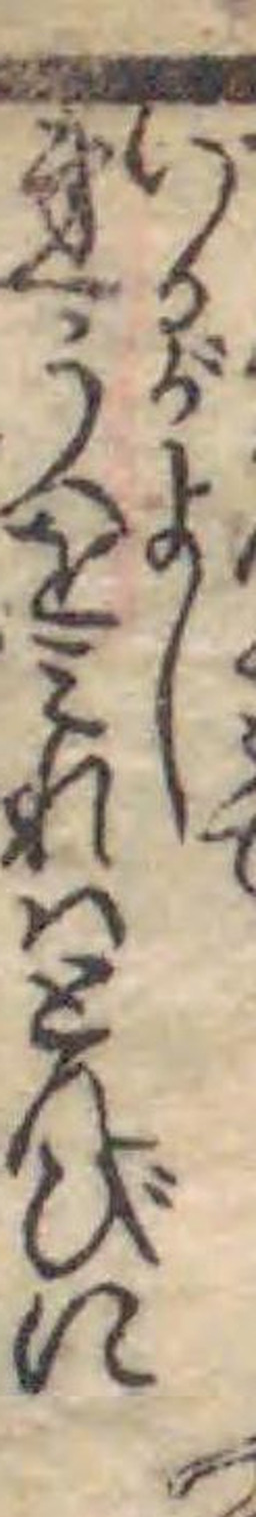第一うへをみれはとんびに
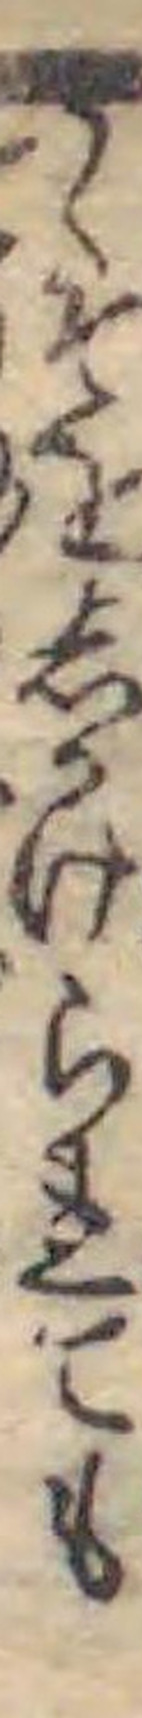くそをしかけられても
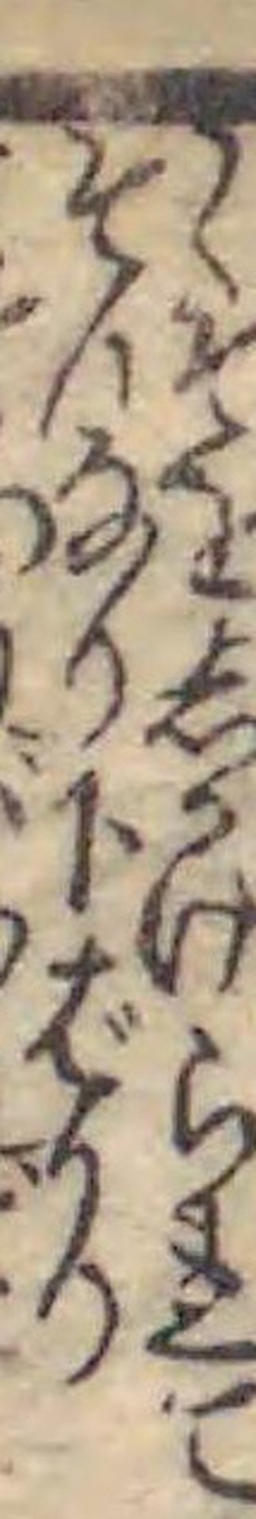そんなり下ばかり
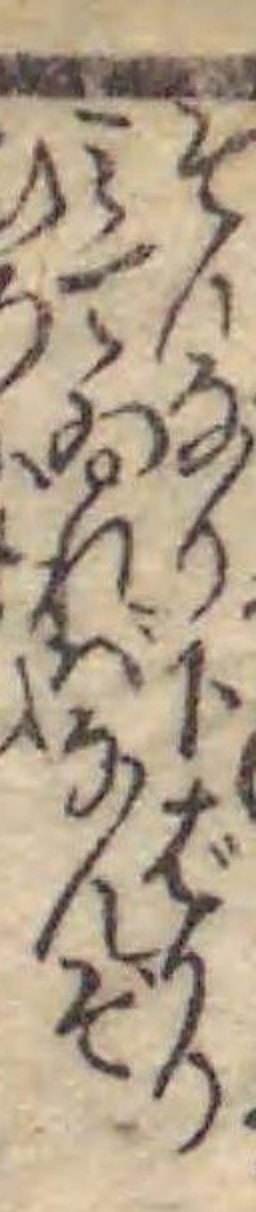みてゐればなんぞ
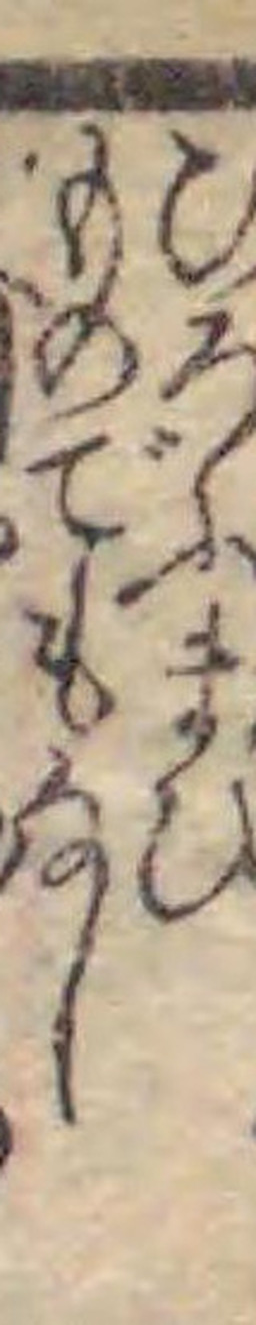ものてもなし
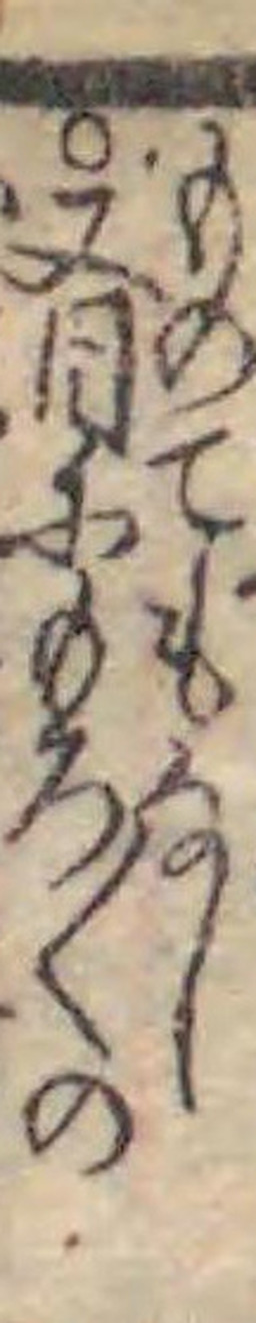○又目にもろ〳〵の
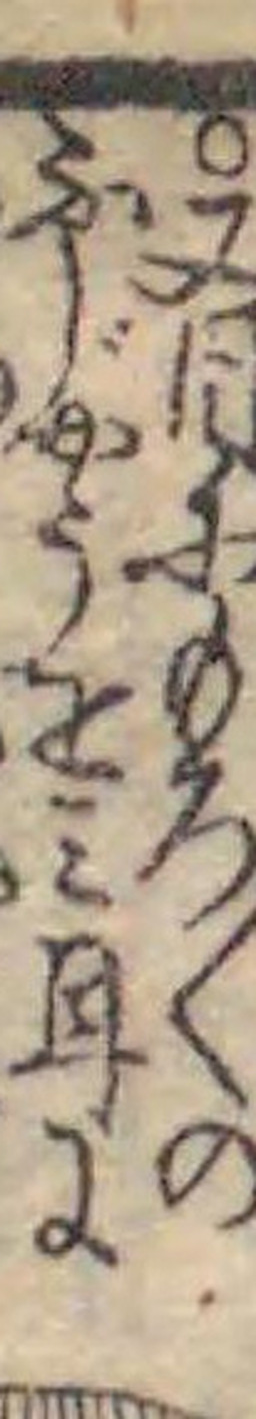ふじやうをみ耳に
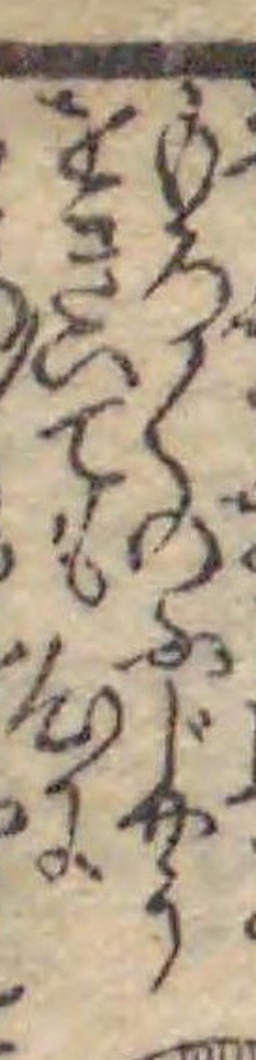をきいても心に
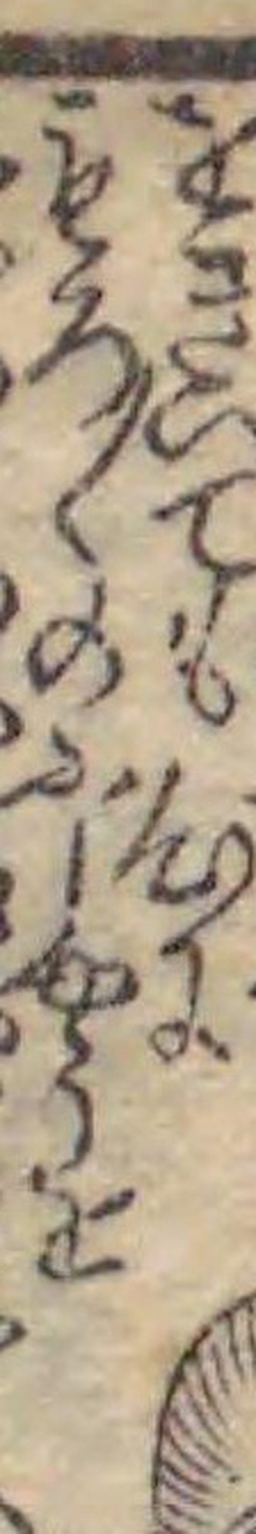もろ〳〵のふしやうを
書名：人心鏡写絵 : 3巻
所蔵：国立国会図書館 National Diet Library, JAPAN
